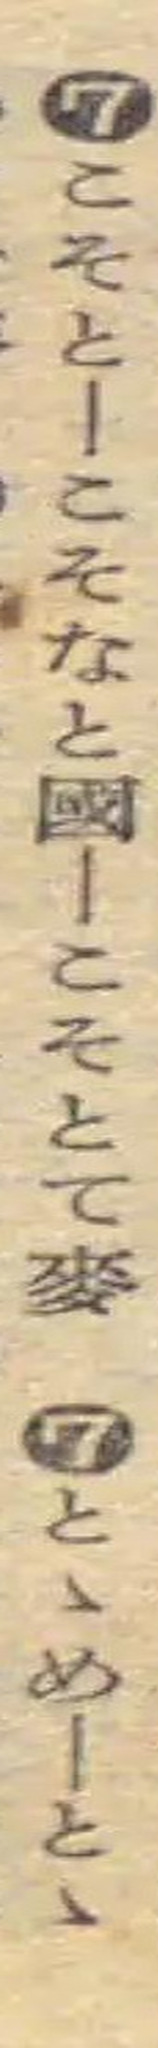❼こそと―こそなと国―こそとて麦❼とゝめ―とゝ
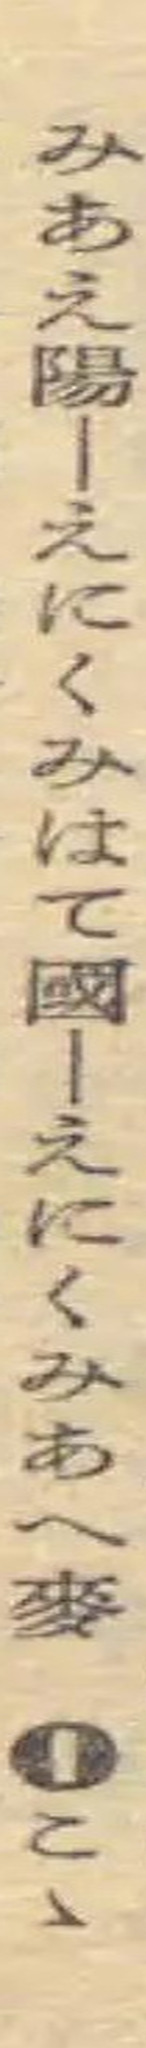みあえ陽―えにくみはて国―えにくみあへ麦➊こゝ
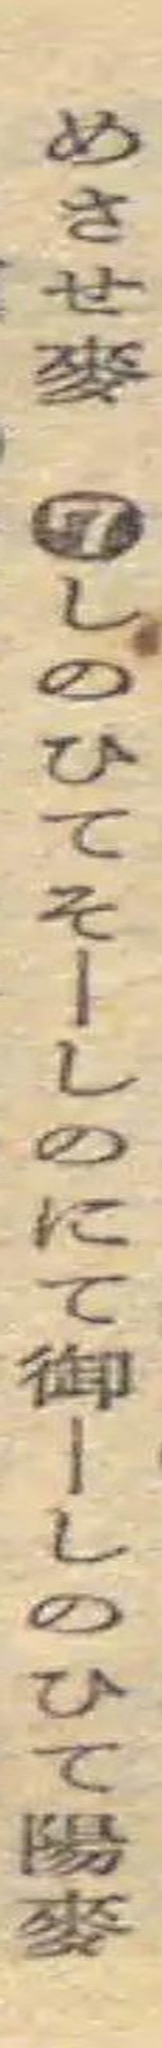めさせ麦❼しのひてそ―しのにて御―しのひて陽麦
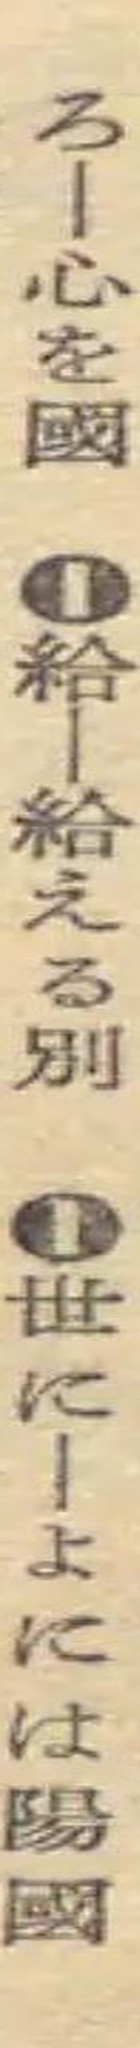ろ―心を國➊給―給える別➊世に―よには陽国
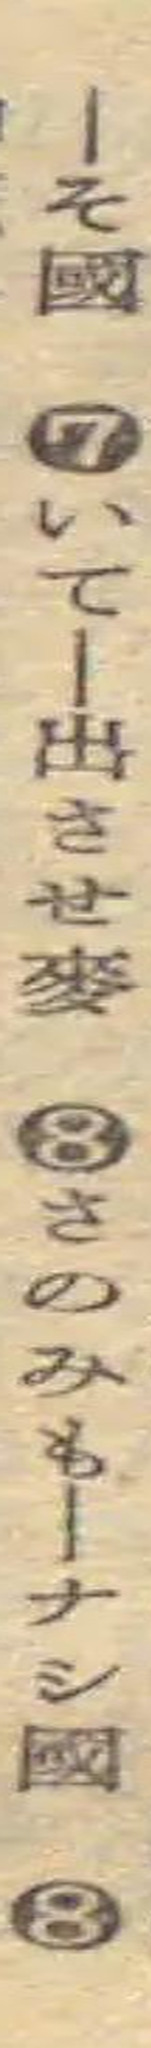―そ国❼いて―出させ麦❽さのみも―ナシ国❽
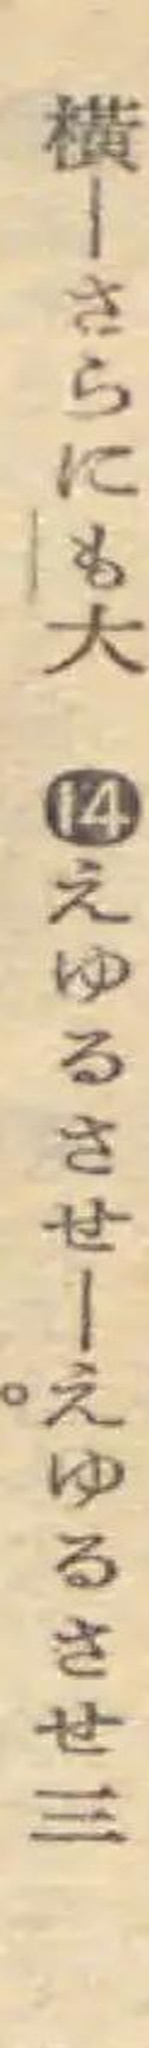横―さらにも大⓮えゆるさせ―えゆるさせ三
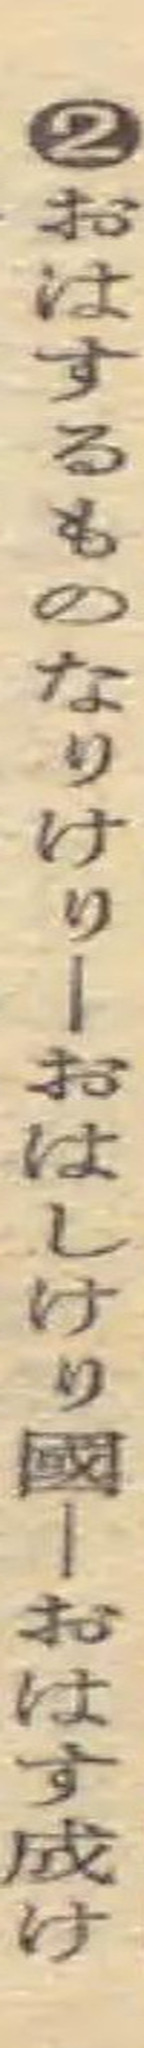➋おはするものなりけり―おはしけり国―おはす成け
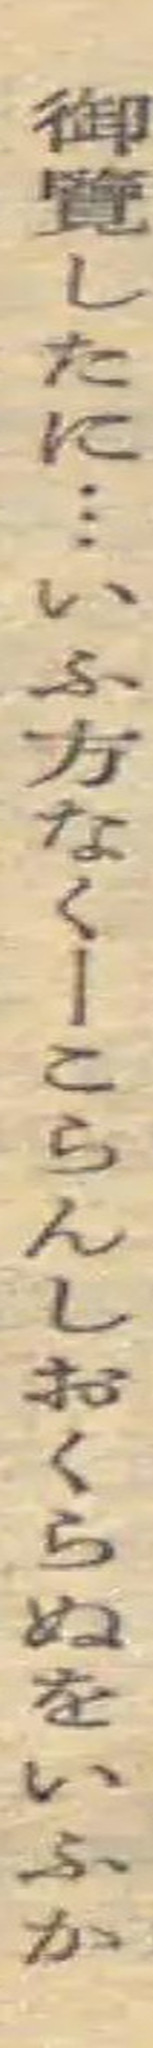御覧したに…いふ方なく―こらんしおくらぬをいふか
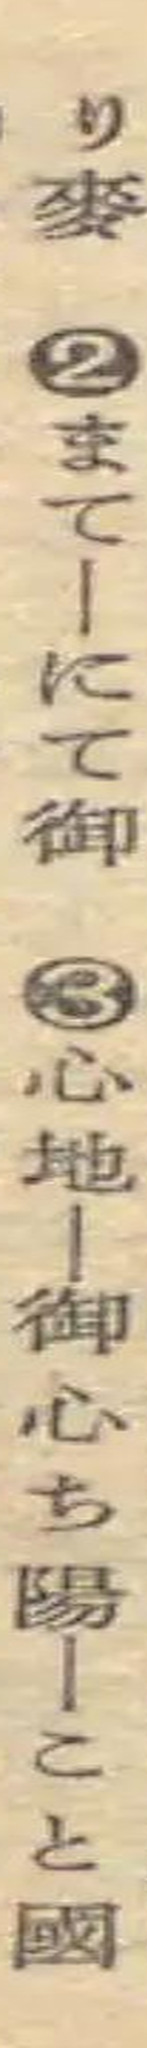り麦➋まて―にて御❸心地―御心ち陽―こと国
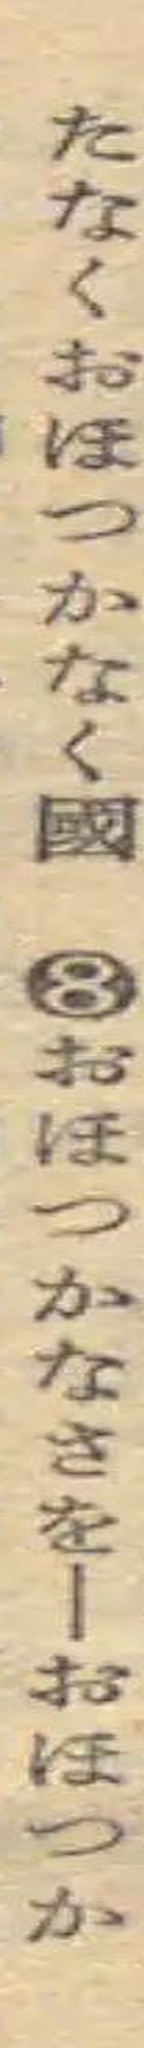たなくおほつかなく国❽おほつかなさを―おほつか
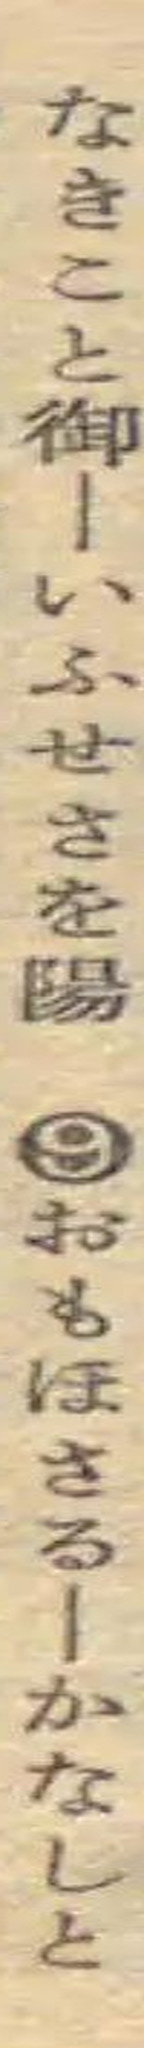なきこと御―いふせさを陽❽おもほさる―かなしと
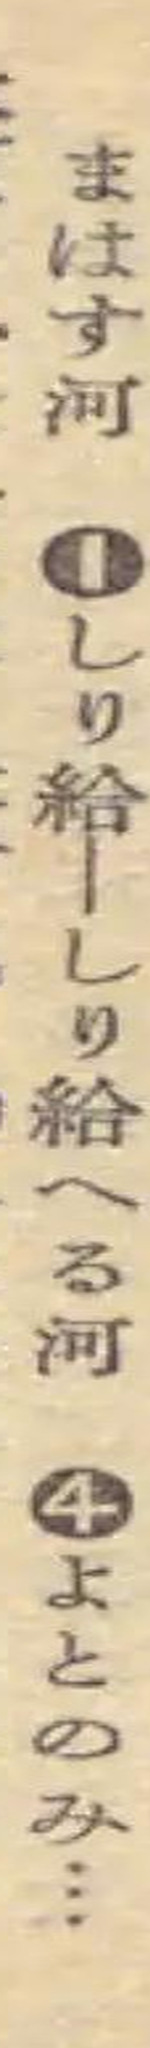まはす河➊しり給―しり給へる河❹よとのみ…
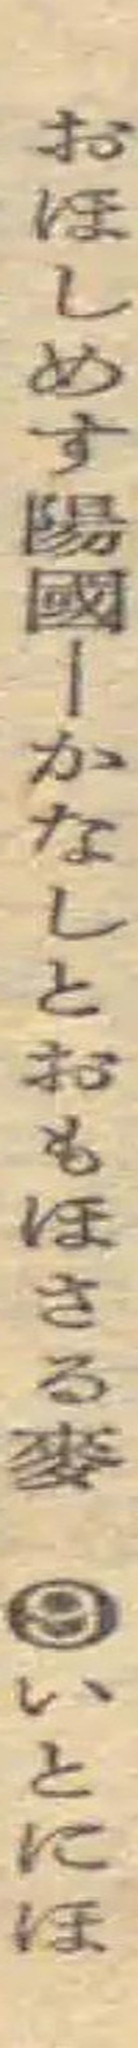おほしめす陽国―かなしとおもほさる麦❾いとにほ
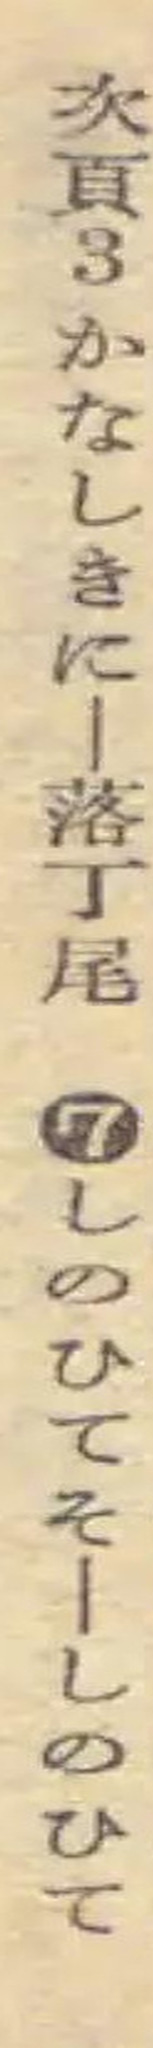次頁３かなしきに―落丁尾❼しのひてそ―しのひて
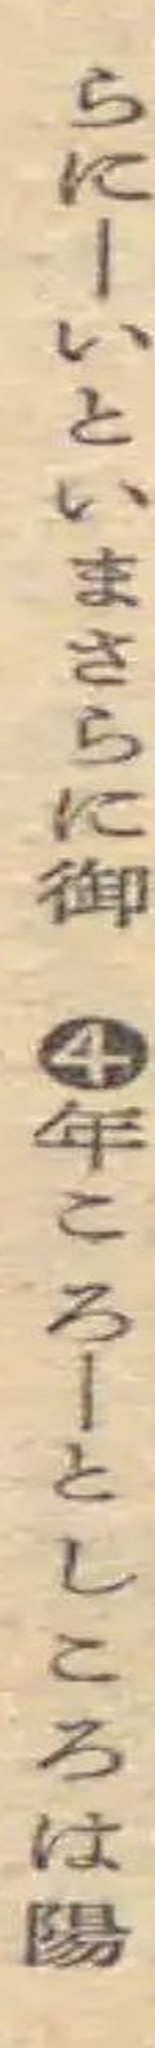らに―いといまさらに御❹年ころ―としころは陽
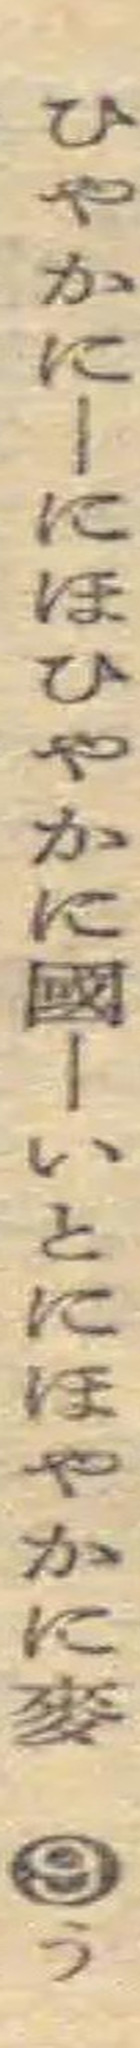ひやかに―にほひやかに国―いとにほやかに麦❾う
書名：校異源氏物語.
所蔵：国立国会図書館 National Diet Library, JAPAN
